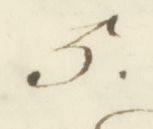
5.
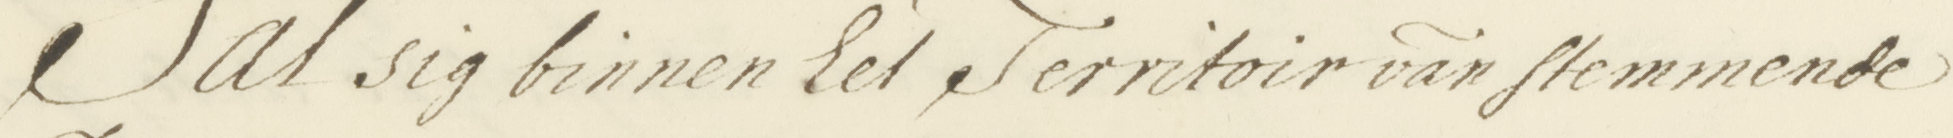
Sal sig binnen het territoir van stemmende
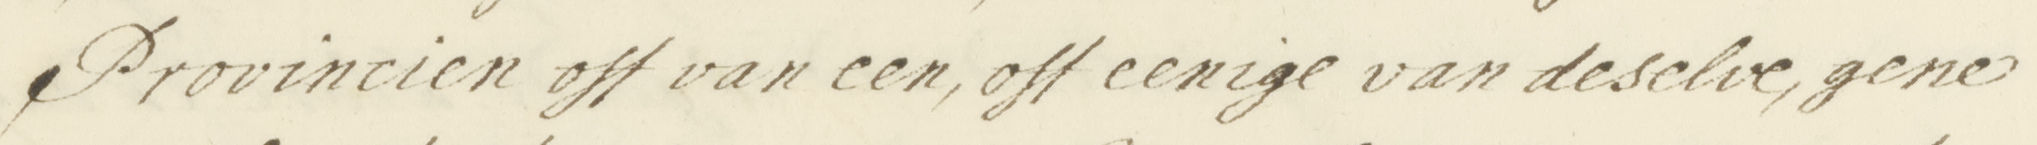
Provincien off van een, off eenige van deselve, gene
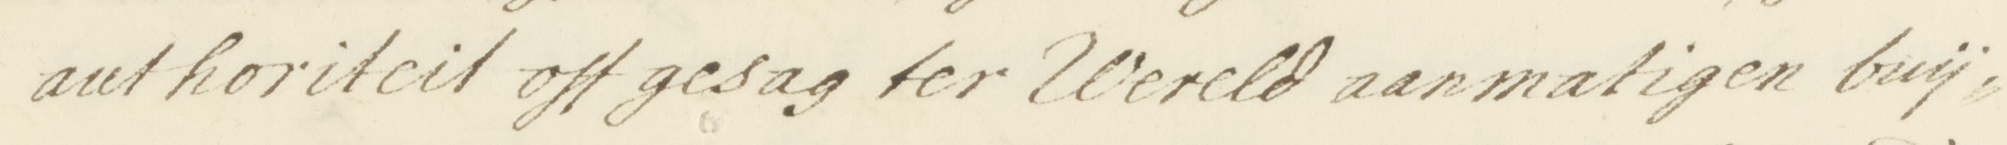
authoriteit oft gesag ter Wereld aanmatigen buij„
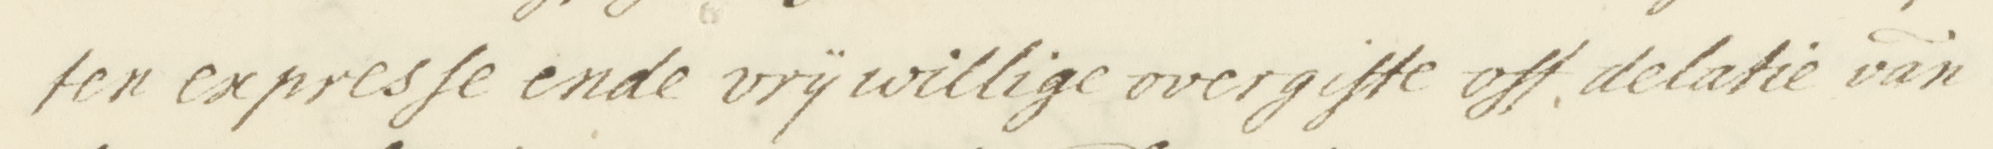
ten expresse ende vrijwillige overgifte oft delatie van
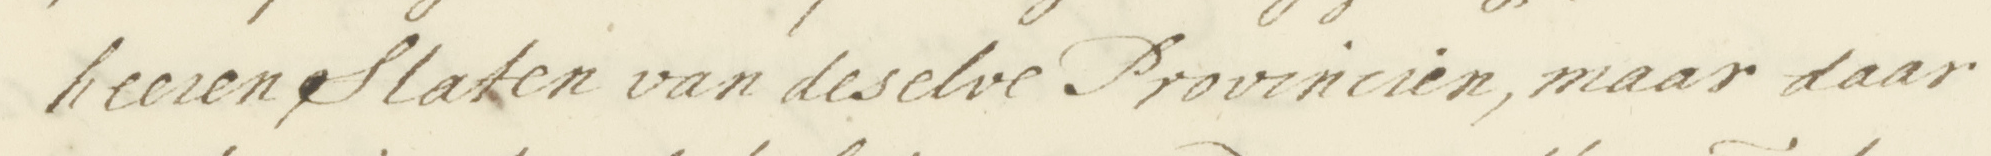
heeren Staten van deselve Provincien, maar daar
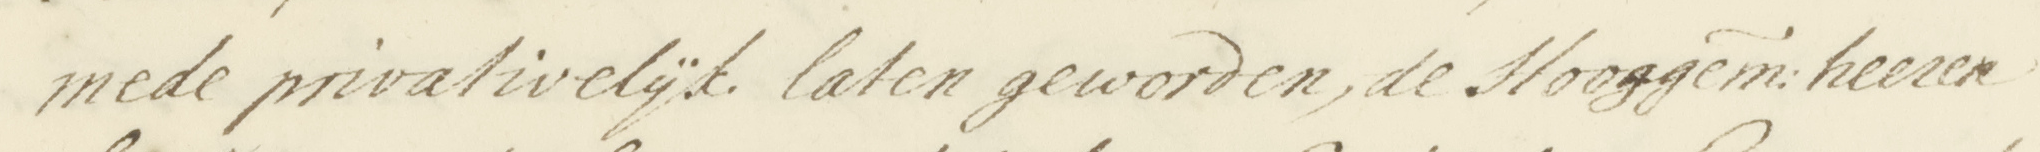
mede privativelijk laten geworden, de Hooggem: heeren
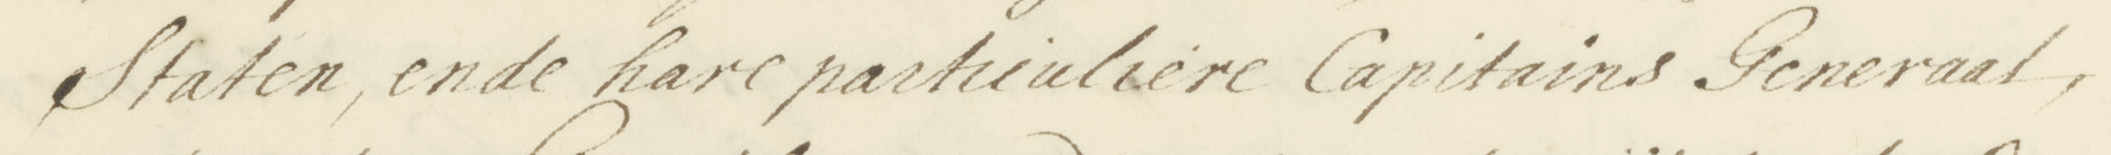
Staten, ende hare particuliere Capitains Generaal,
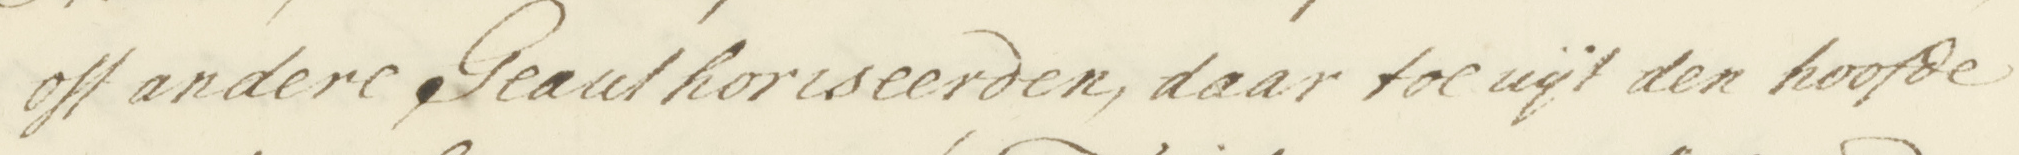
off andere Geauthoriseerden, daar toe uijt den hoofde
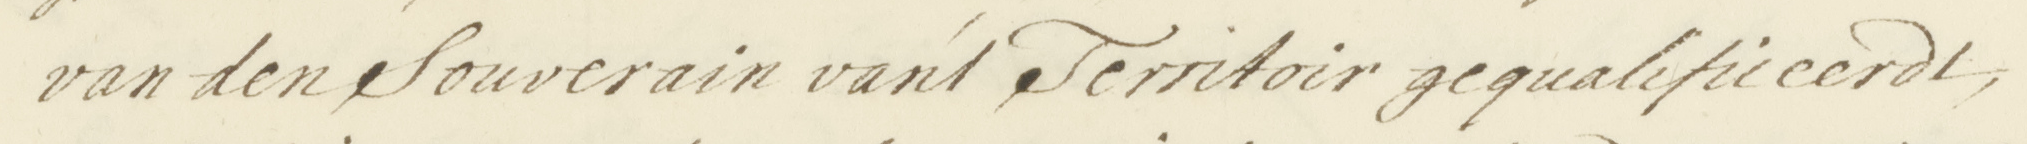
van den Souverain van't Territoir gequaliticeerdt,
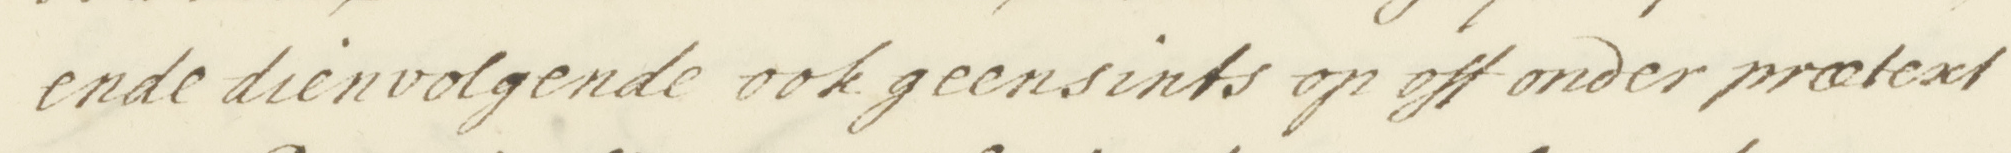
ende dienvolgende ook geensints op off onder pretext
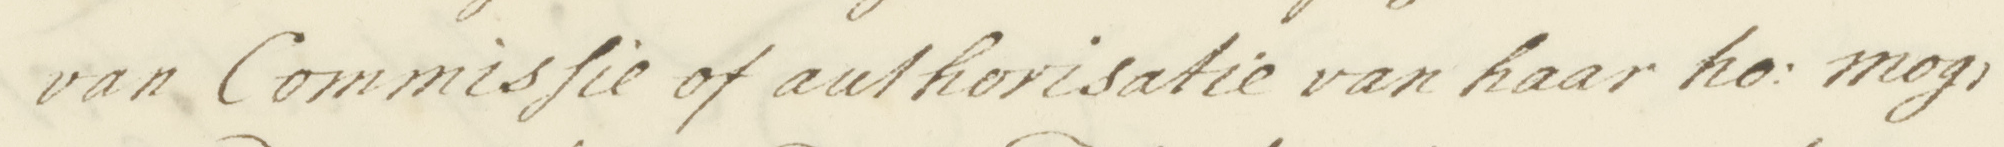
van Commissie of authorisatie van haar ho: mog:
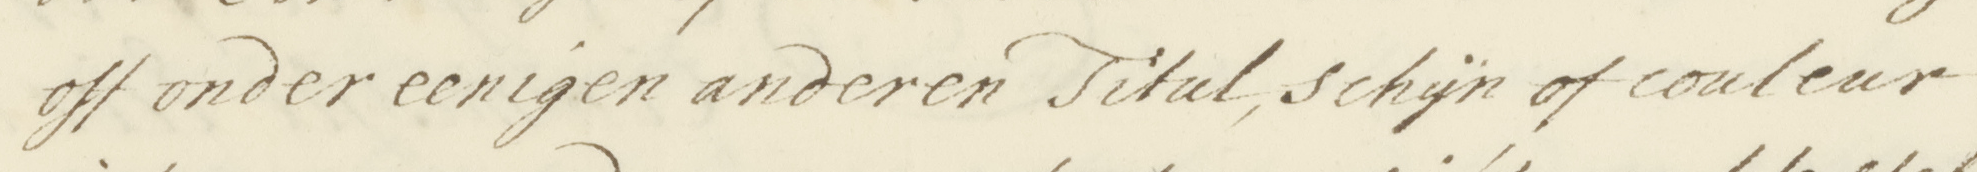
off onder eenigen anderen Titul, schijn of conteur
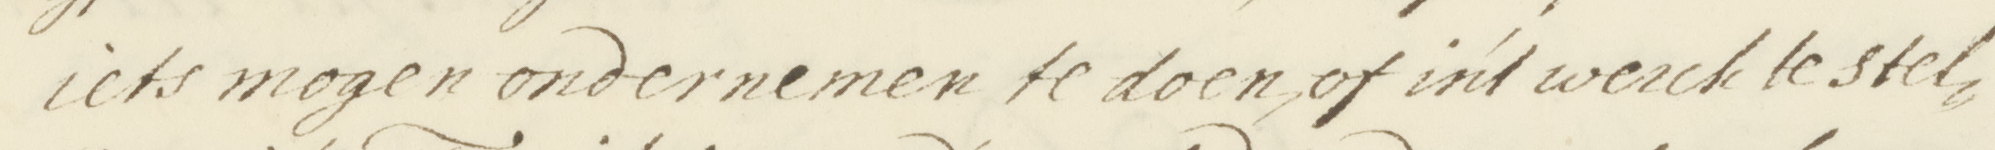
iets mogen ondernemen te doen, of in't werck te stel„
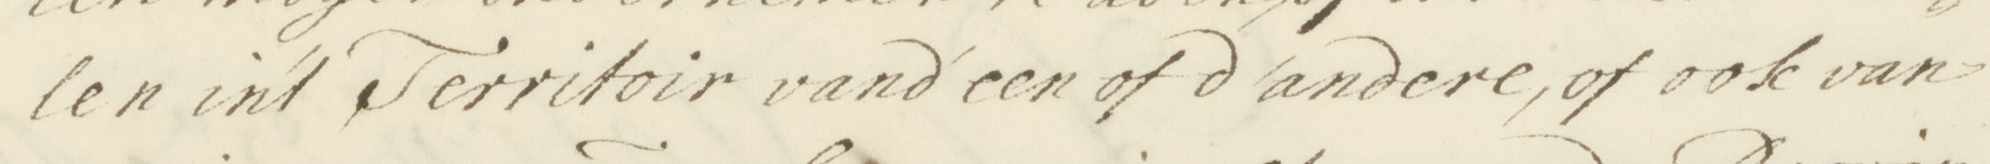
len in't Territoir vand'een of d'andere, of ook van
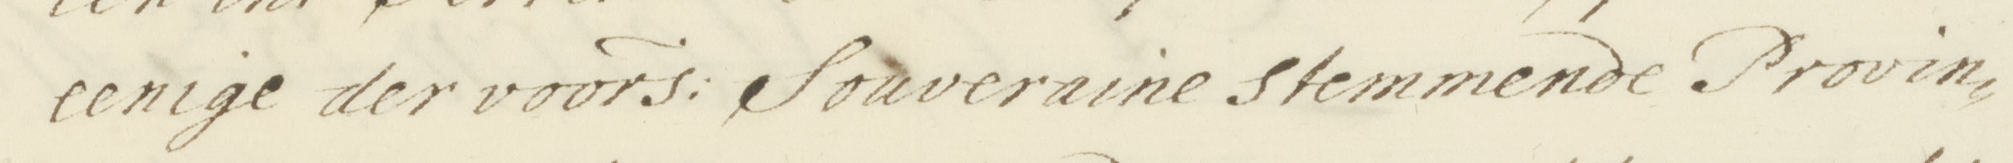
eenige der voors: souveraine stemmende Provin,,
